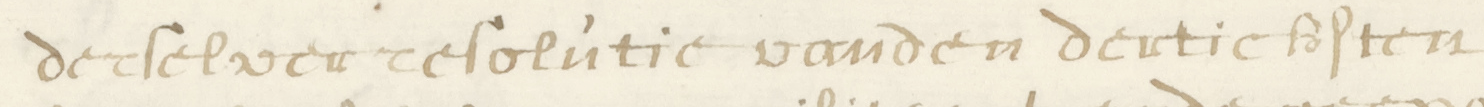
derselver resolutie vanden dertichsten
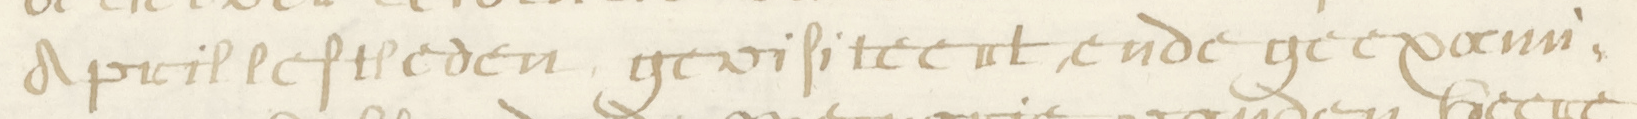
April lestleden, gevisiteert, ende geexami,,
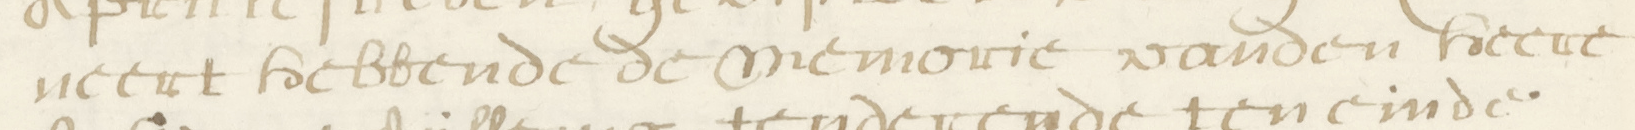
neert hebbende de memorie vanden heere
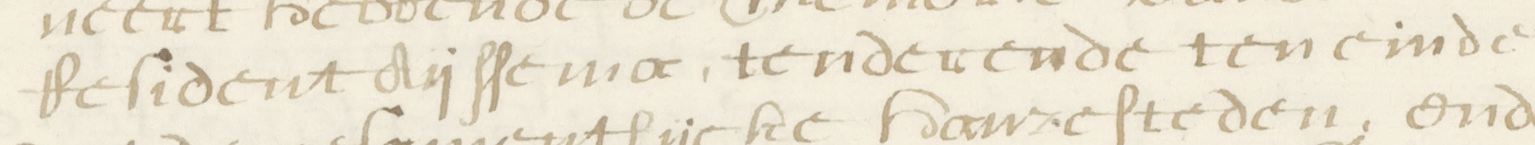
Resident Aijssema, tenderende ten einde
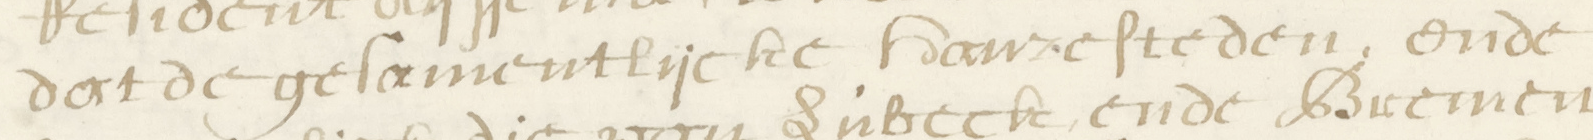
dat de gesamentlijcke hanzesteden, ende
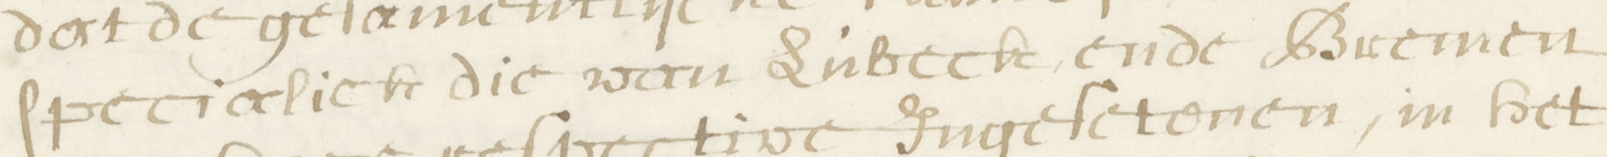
specialick die van Lubeck ende Bremen,
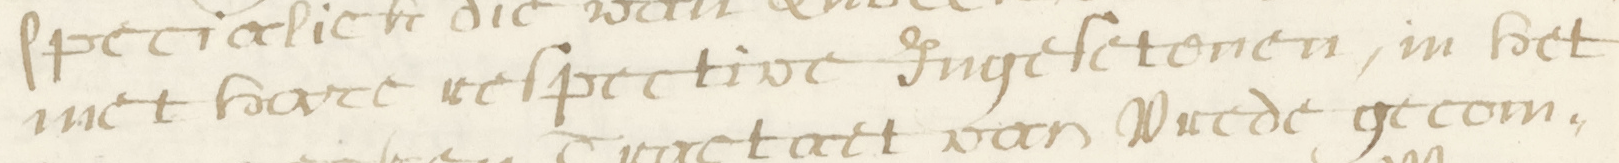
met hare respective Ingesetenen, in het
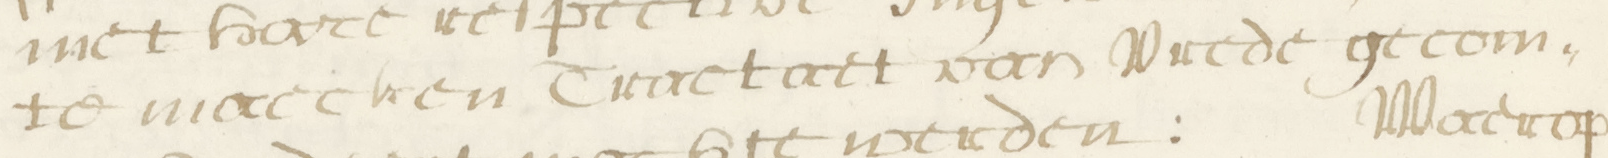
te maecken Tractaet van Vrede gecom,,
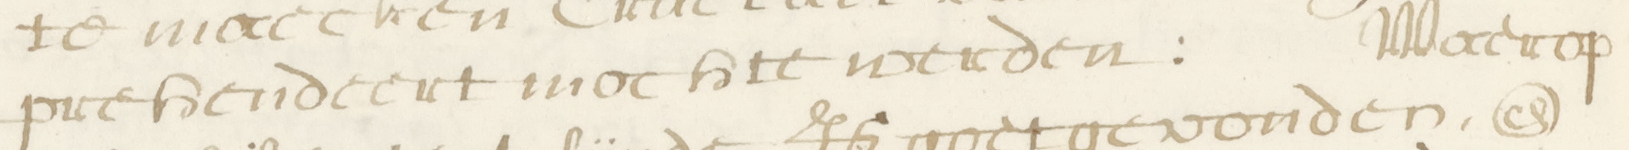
prehendeert mochte werden: Waerop
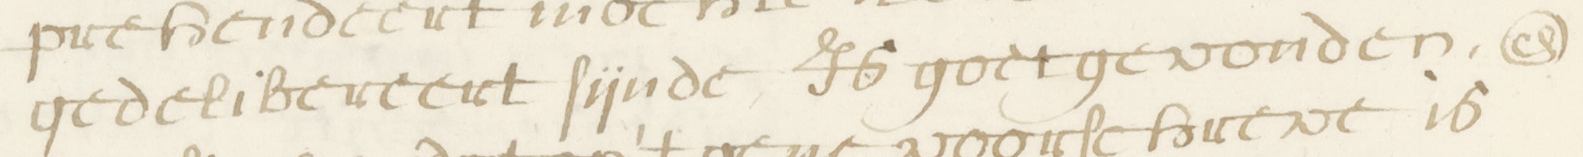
gedelibereert sijnde, Is goetgevonden, &
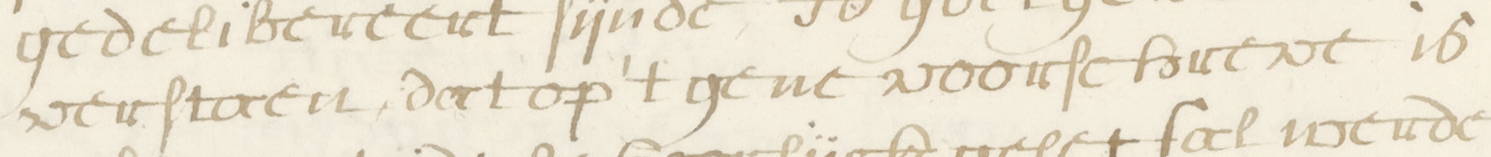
verstaen, dat op't gene voorschreve is
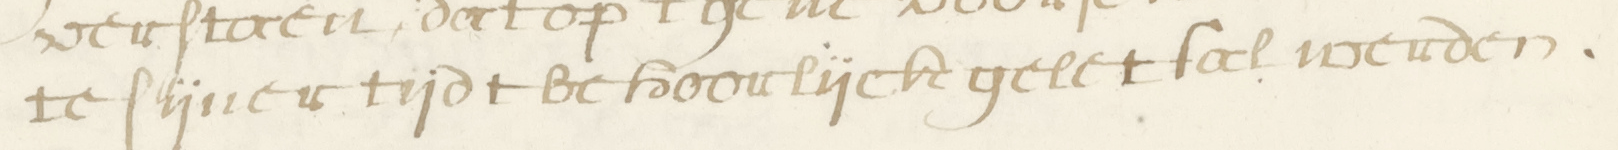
te sijner tijdt behoorlijck gelet sal werden.
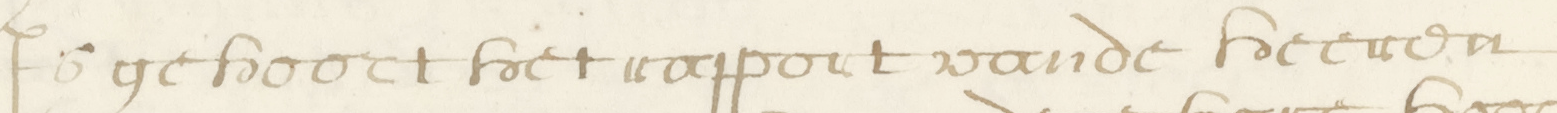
Is gehoort het rapport vande heeren
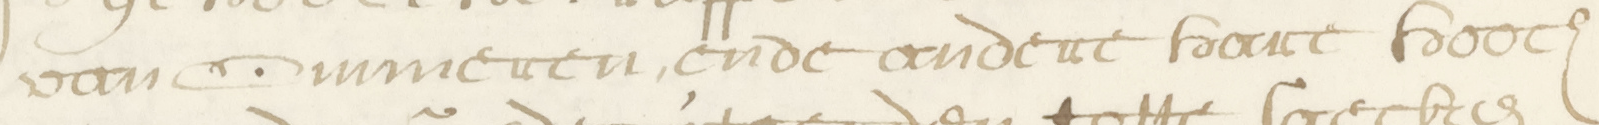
van Ommeren, ende andere hare hooch
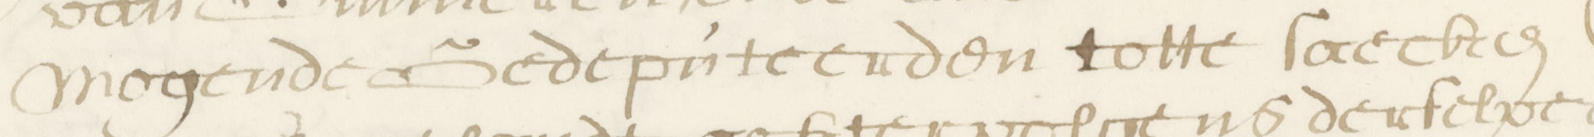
mogende Gedeputeerden totte saecken
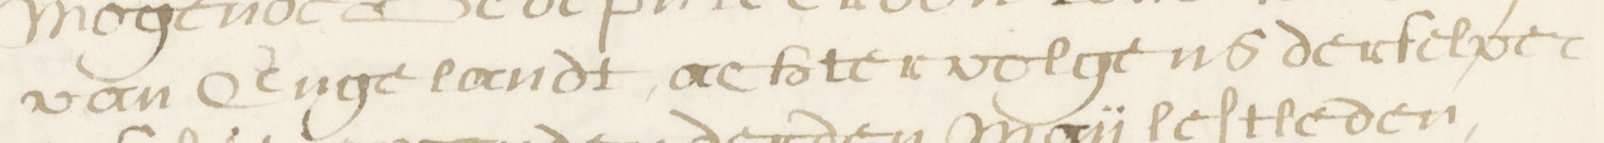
van Engelandt, achtervolgens derselver
